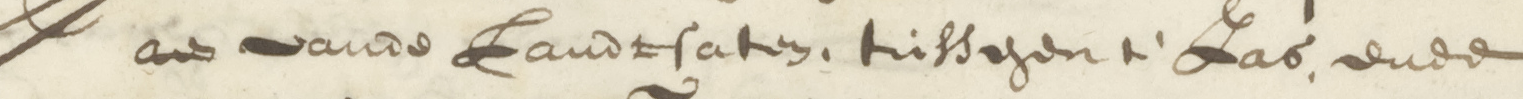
aen vande Landtsaten, tusschen t‛ Zas ende
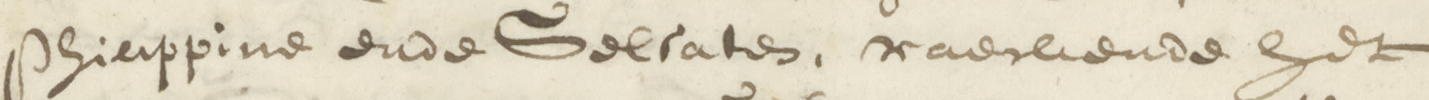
Philippine ende Selsaten, raeckende het
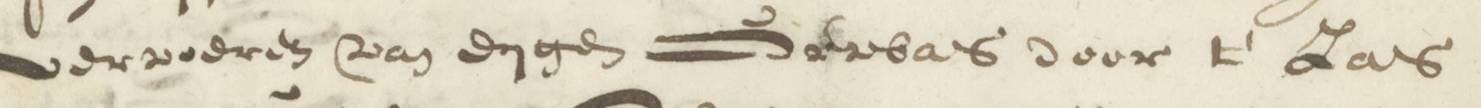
vervoeren van eygen Gewas door t‛ Zas —
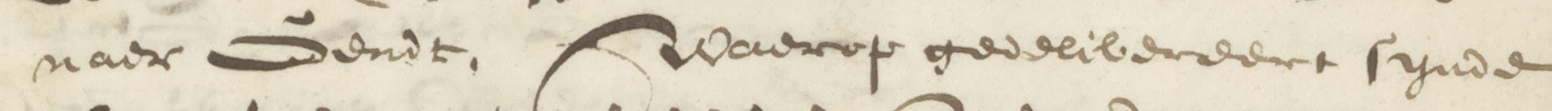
naer Gendt. Waerop gedelibereert synde
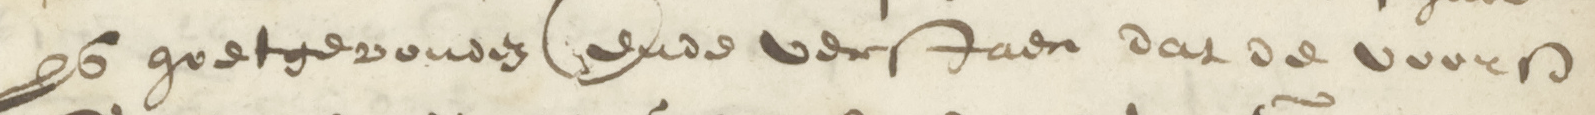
Is goetgevonden ende verstaen dat de voors
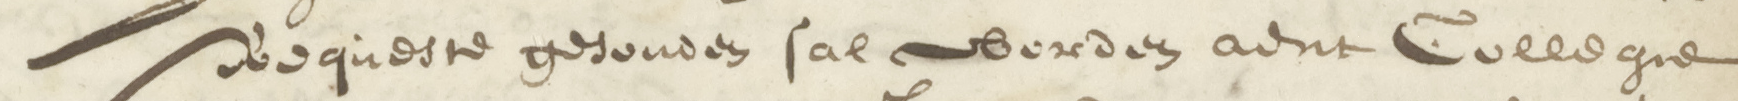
Requeste gesonden sal worden aent Collegie
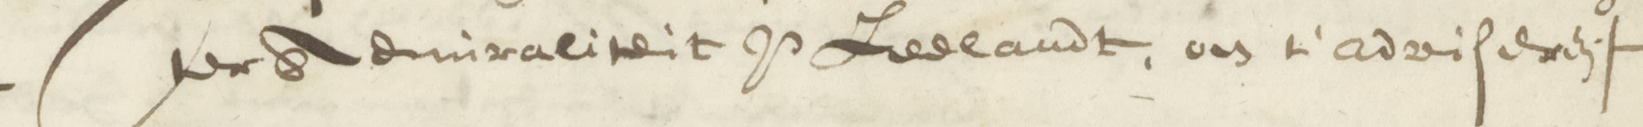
ter Admiraliteit in Zeelandt, om t' adviseren.
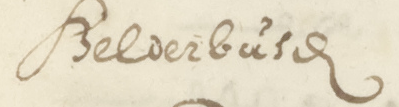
Belderbuse
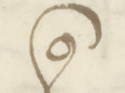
ca.
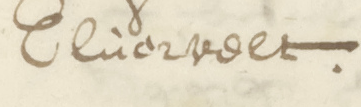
Eluervelt.
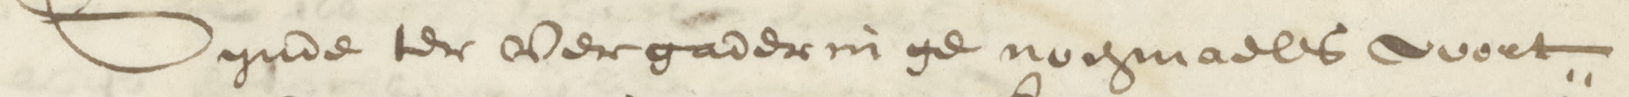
Synde ter Vergaderinge nochmaels voort„
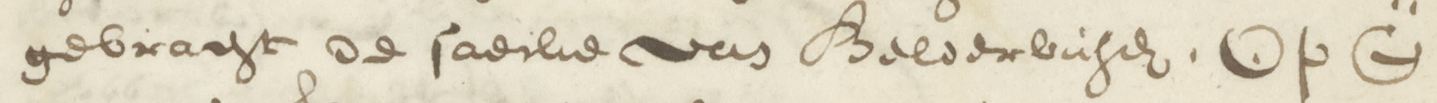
gebracht de saecke van Belderbuse, Op &
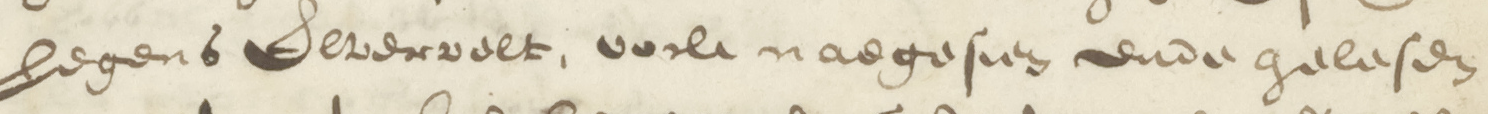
Jegens Elvervelt, oock naegesien ende gelesen
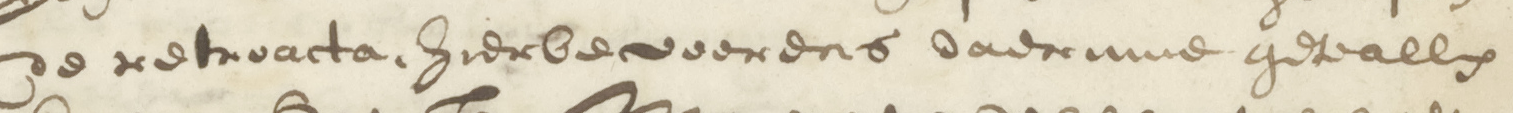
de retroacta hierbevoorens daerinne gevallen,
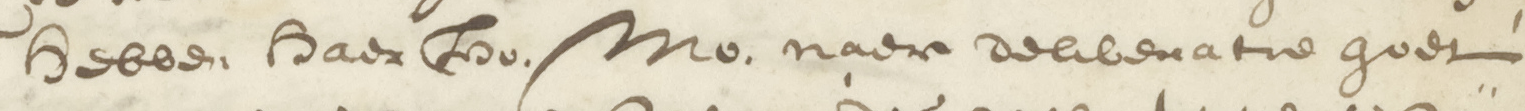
hebben Haer Ho.Mo. naer deliberatie goet„
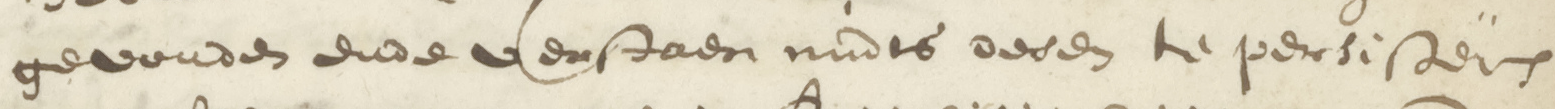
gevonden ende verstaen midts desen te persisteren
